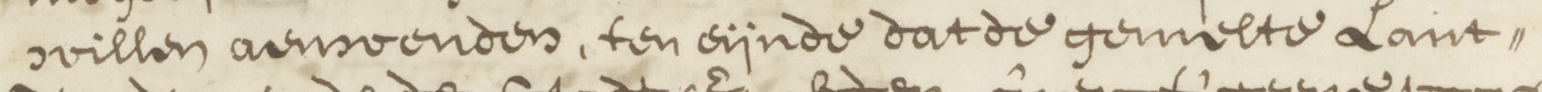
willen aenwenden, ten eijnde dat de gemelte Lant„
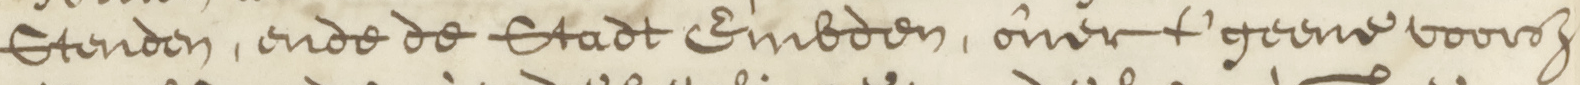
Stenden, ende de Stadt Embden, ouer t' geene voorsz
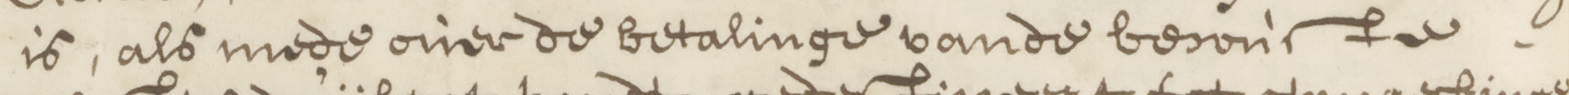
is, als mede ouer de betalinge vande bewuste -
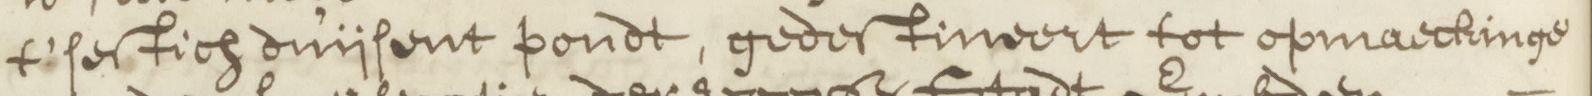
t'sestich duijsent pondt, gedestineert tot opmaeckinge
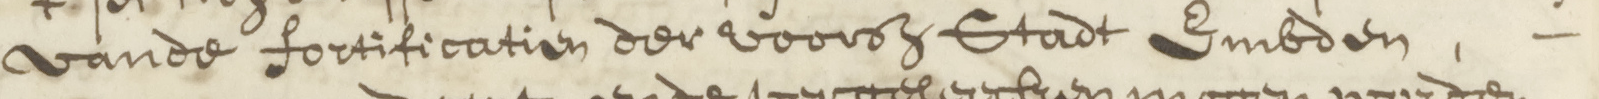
vande fortificatien der voorsz Stadt Embden, -
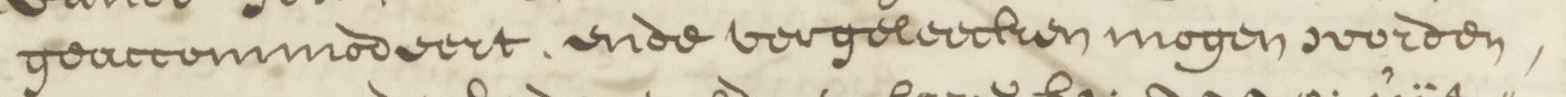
geaccommodeert, ende vergeleecken mogen worden,
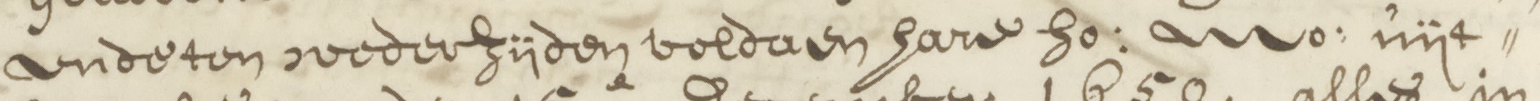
Ende ten wederzijden voldaen hare ho:Mo: uijt „
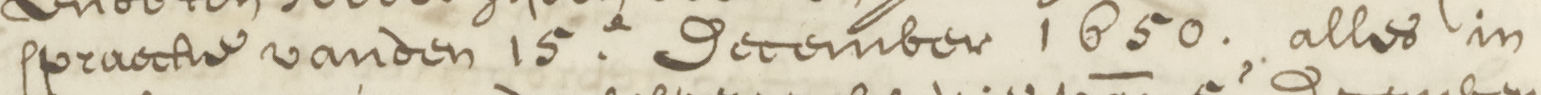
spraecke vanden 15e. December 1650. alles in
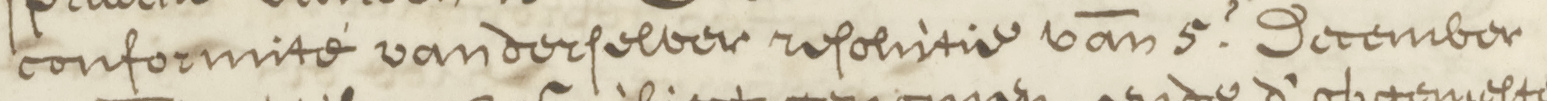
conformité van derselver resolutie van 5e. December
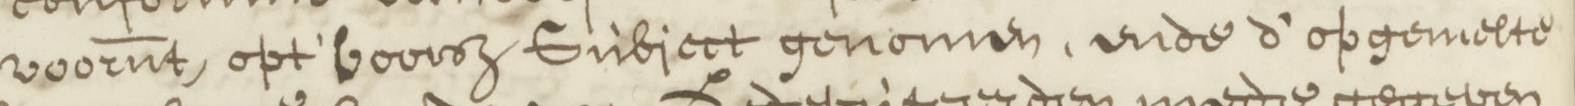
voornt, opt' voorsz Subject genomen, ende d'opgemelte
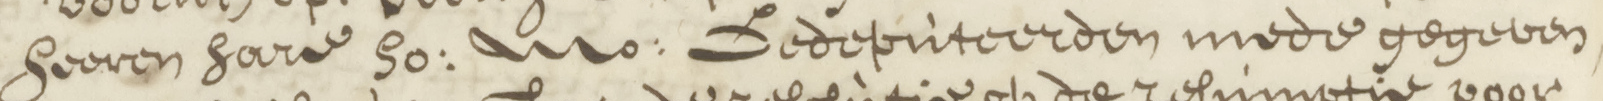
heeren hare ho: Mo: Gedeputeerden mede gegeven.
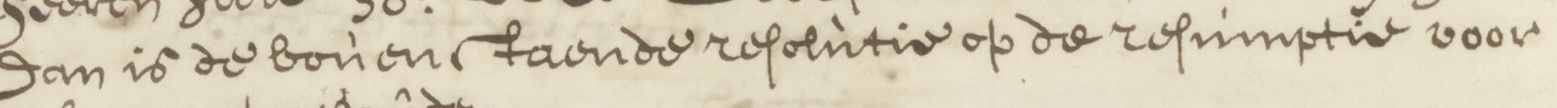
Dan is de bouenstaende resolutie op de resumptie voor
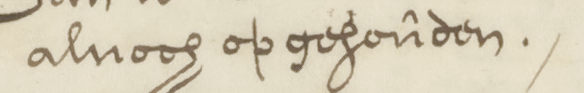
alnoch opgehouden.
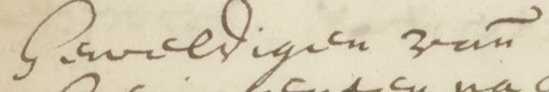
Geweldigen van
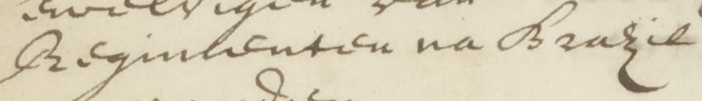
Regimenten na Brazil
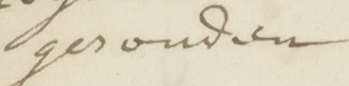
gesonden
